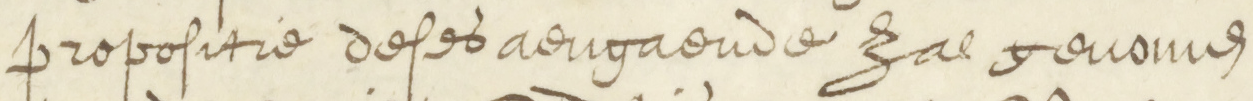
propositie deses aengaende zal genomen
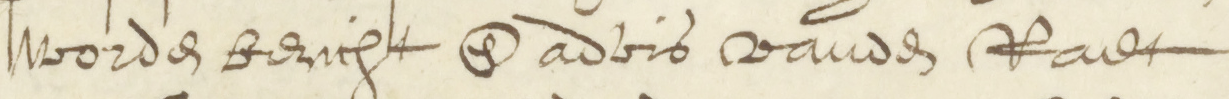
worden bericht & advis vanden Raet
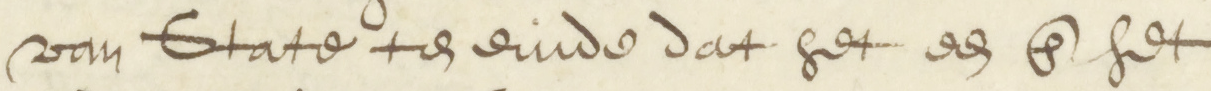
van State ten einde dat het een & het
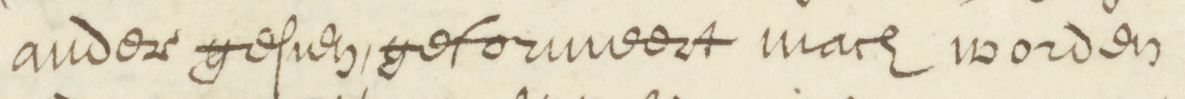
ander gesien, geformeert mach worden
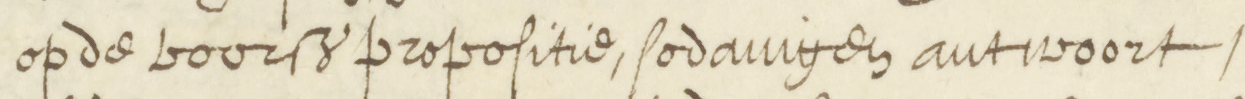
op de voors propositie, sodanigen antwoort,
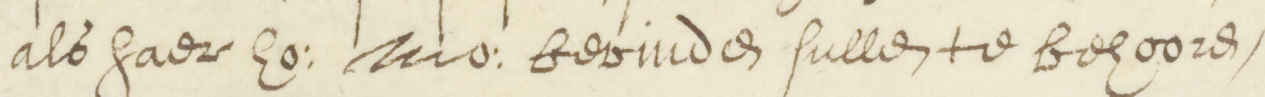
als haer ho:Mo: bevinden sullen te behooren.
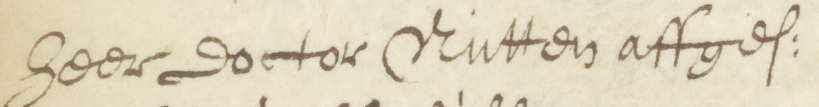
heer Doctor Nutten affges:
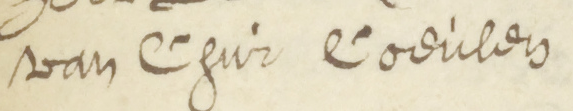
van Chur Coeulen
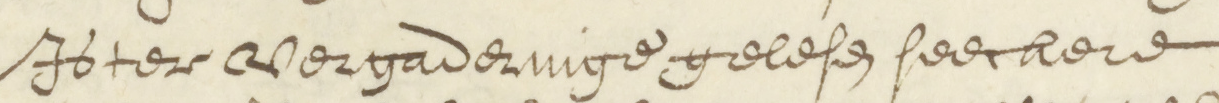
Is ter Vergaderinge gelesen seeckere
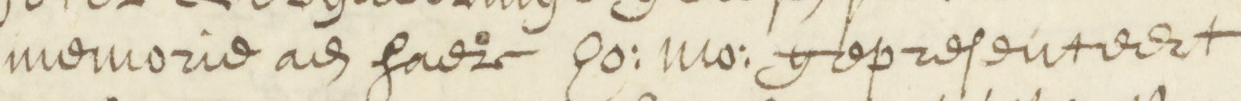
memorie aen haer ho:Mo: gepresenteert
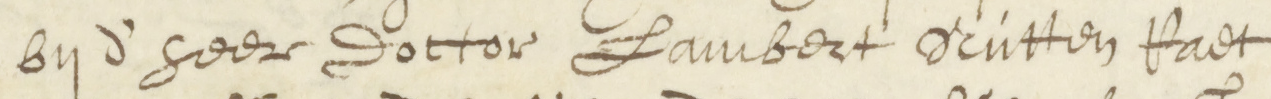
bij d'heer Doctor Lambert Nutten Raet
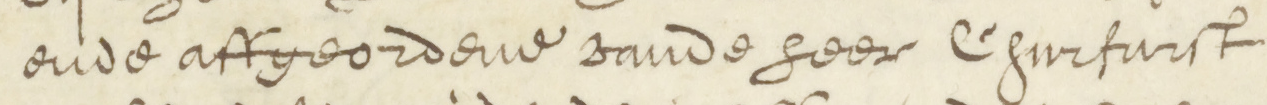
ende affgeordene vande heer Churfurst
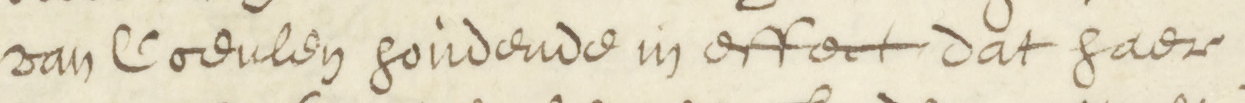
van Coeulen houdende in effect dat haer
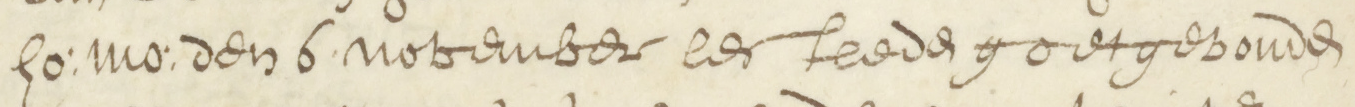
ho:mo: den 6. november lestleden goetgevonden
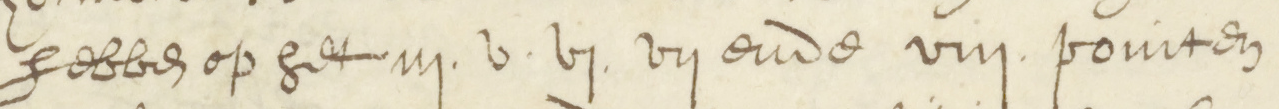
hebben op het iij. v. vj. vij ende viij. pointen
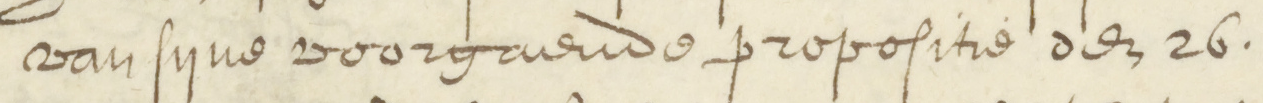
van syne voorgaende propositie den 26.
